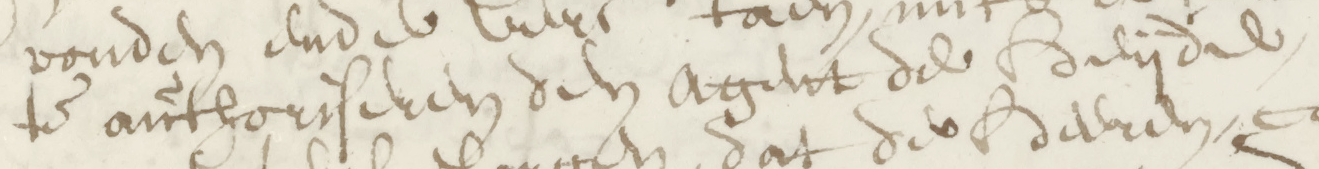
te authoriseren den agent de Heijde
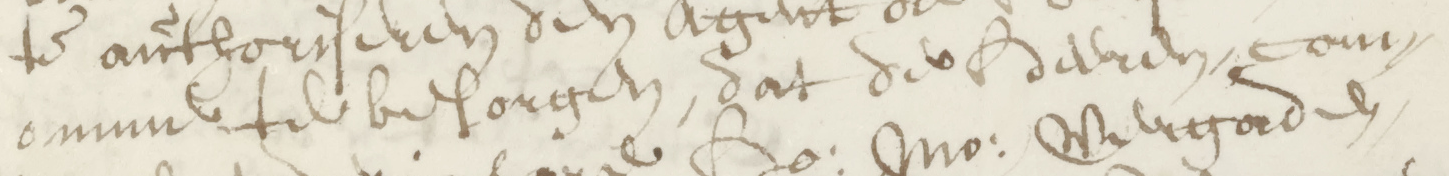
omme te besorgen, dat de Heeren, com„
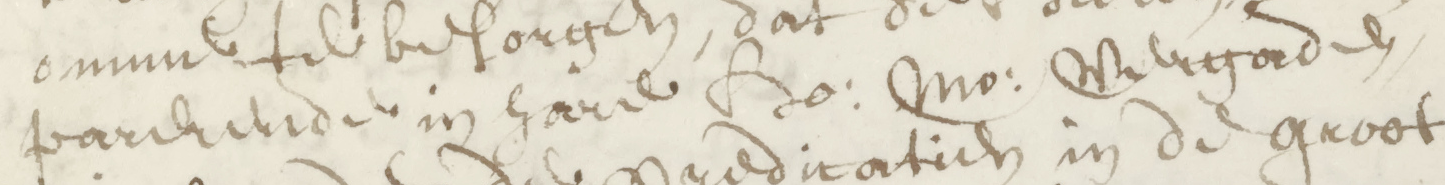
parerende in hare Ho:Mo: Vergade,
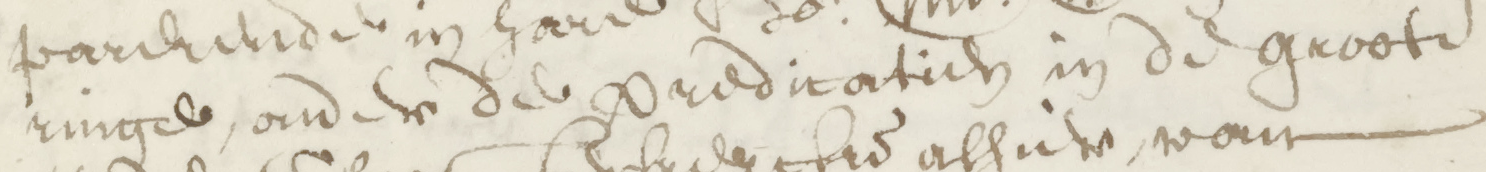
ringe, onder de predicatien in de groote
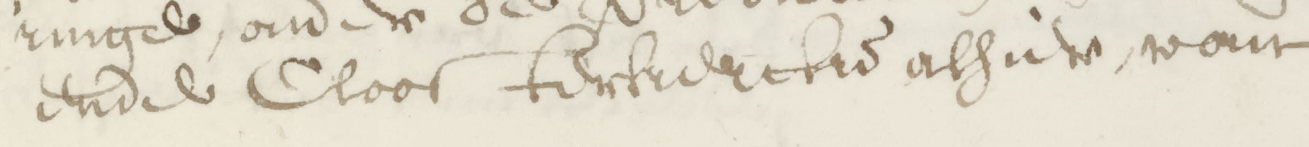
ende Cloosterkercke alhier, van
